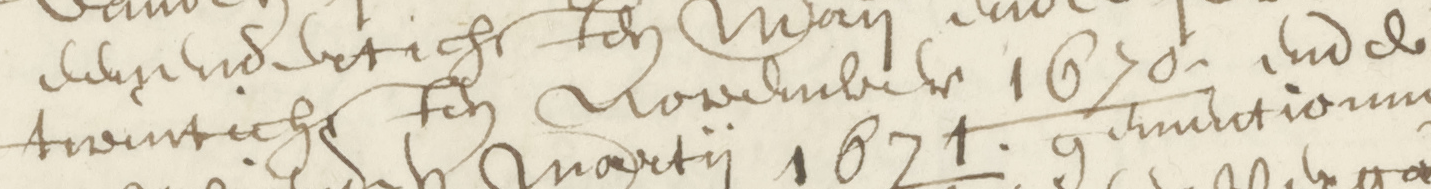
twintichsten November 1670. ende
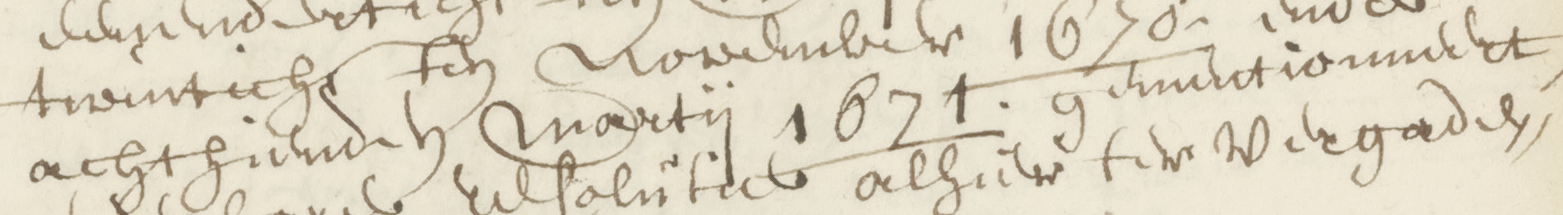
achthienden Martij 1671. gementionneert,
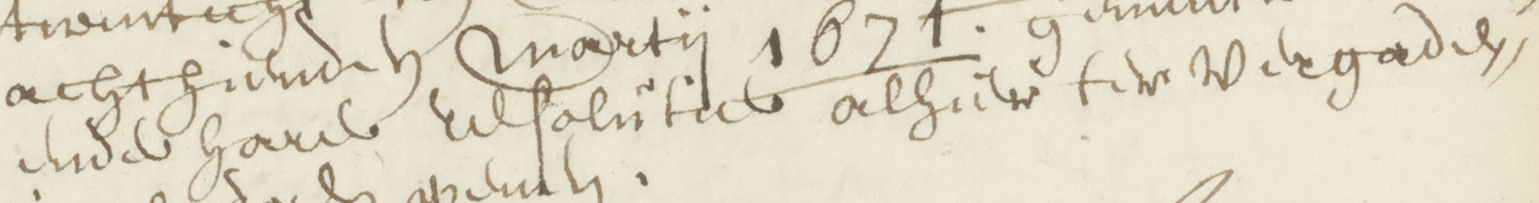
ende hare resolutie alhier ter Vergade„
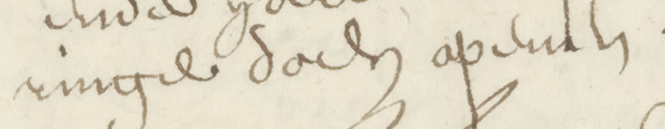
ringe doen openen.
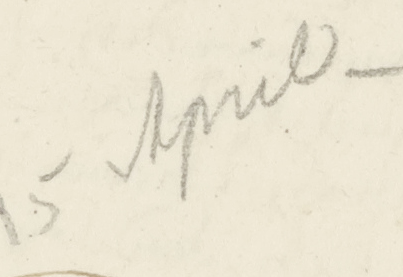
15 April
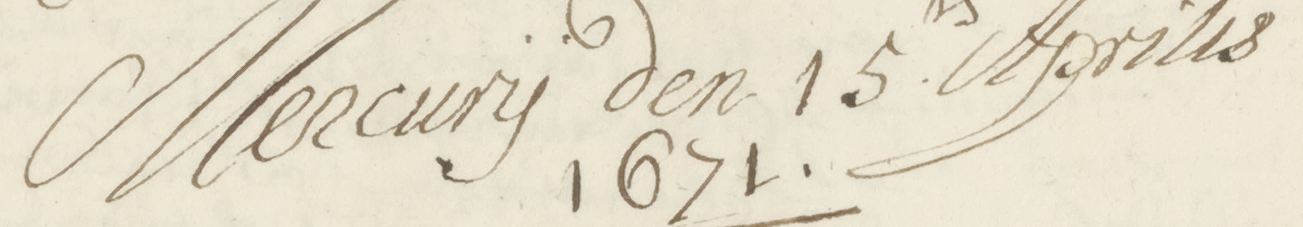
Mercurij den 15en. Aprilis
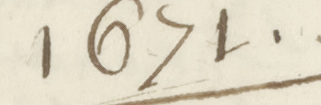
1671.
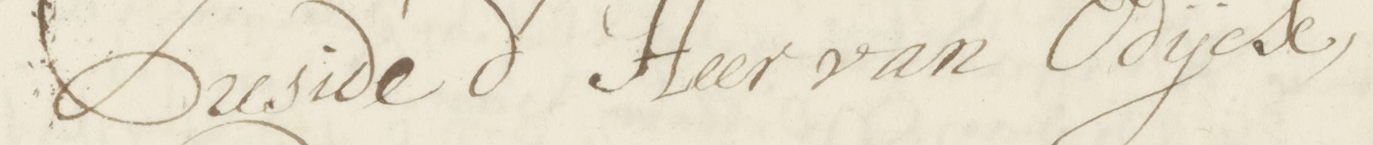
Preside d'Heer van Odijck,
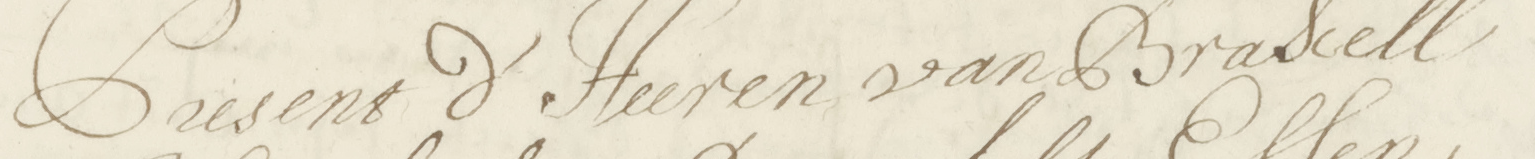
Present d'Heeren van Brakell,
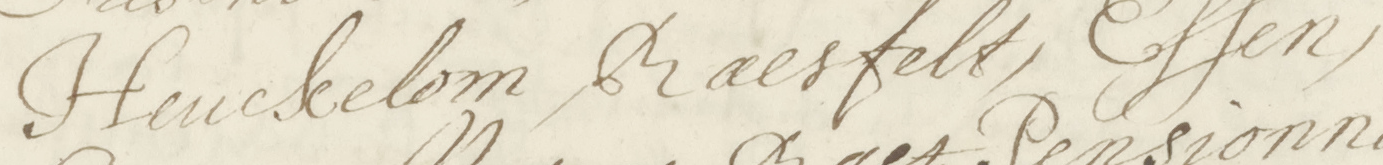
Heuckelom, Raesfelt, Essen,
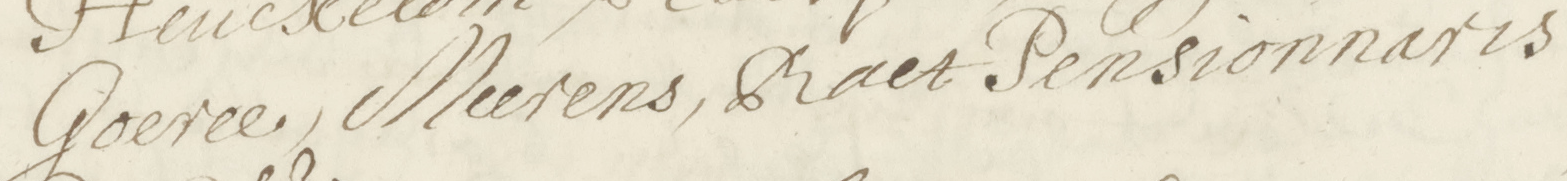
Goeree, Meerens, Raet Pensionnaris
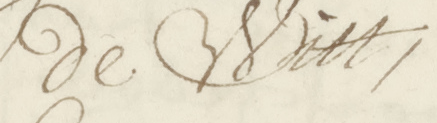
De Witt,
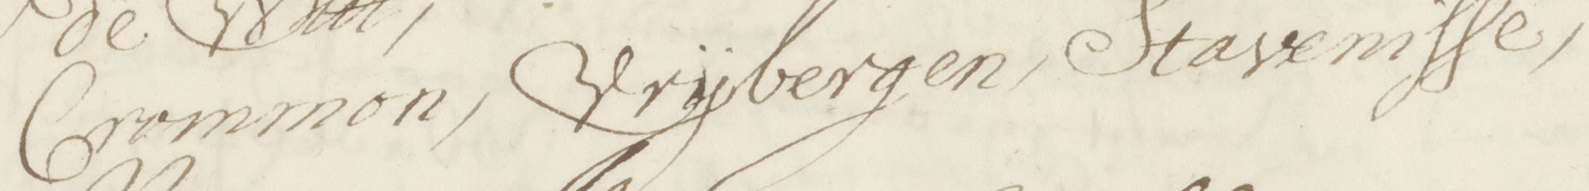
Crommon, Vrijbergen, Stavenisse,
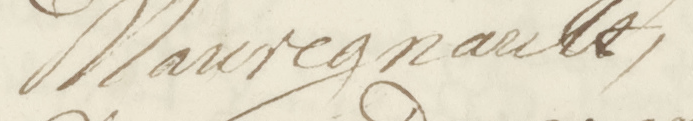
Mauregnault,
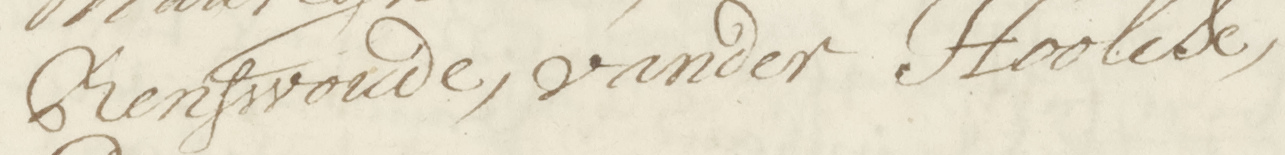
Renswoude, vander Hoolck,
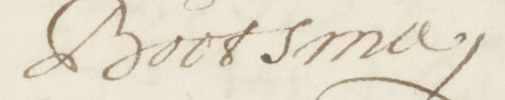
Bootsma,
